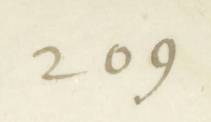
209
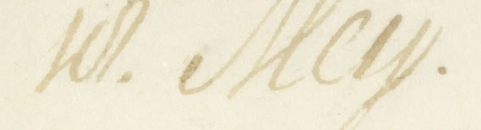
18. Meij.
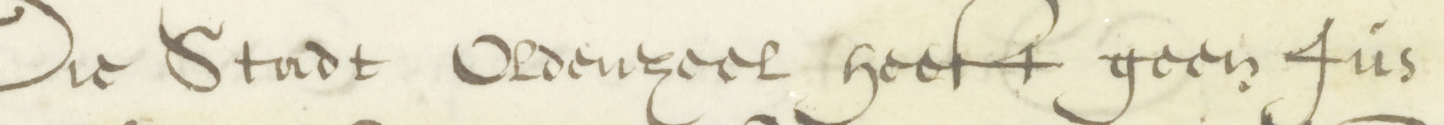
Die Stadt Oldenzeel heeft geen Jus
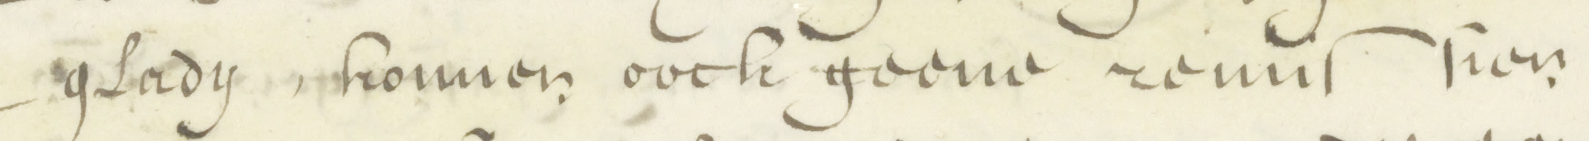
glady, konnen oock geene remissien
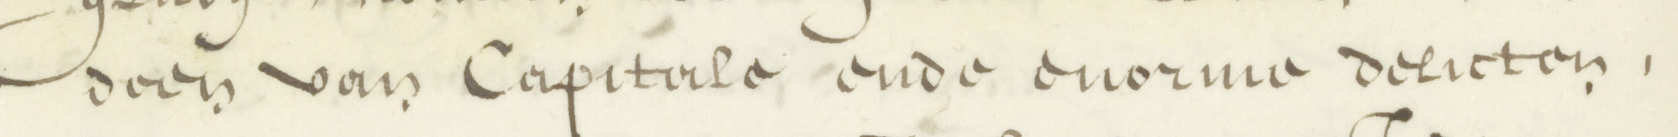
doen van Capitale ende enorme delicten,
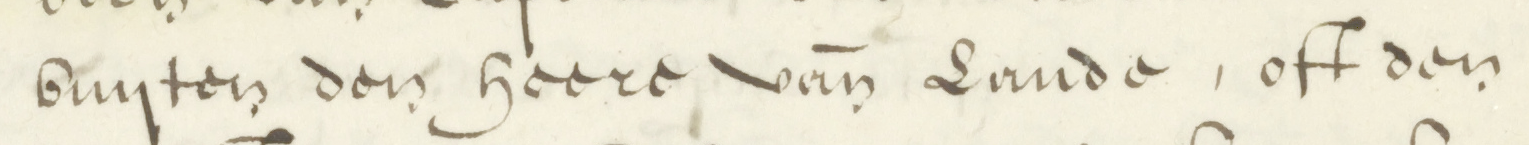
buyten den heere van Lande, off den
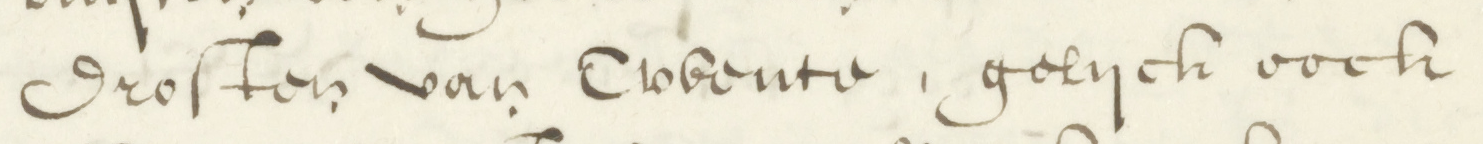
Drosten van Twente, gelijck oock
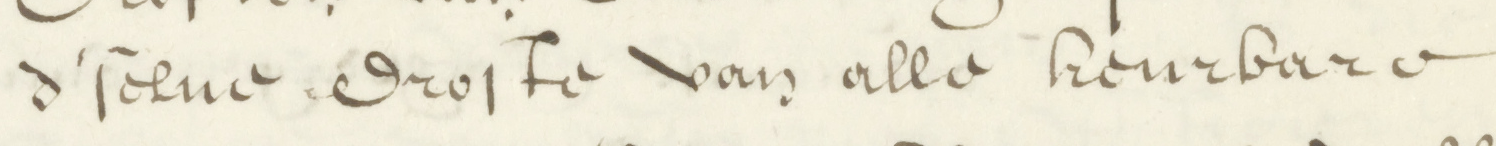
d'selue, Droste van alle keurbare
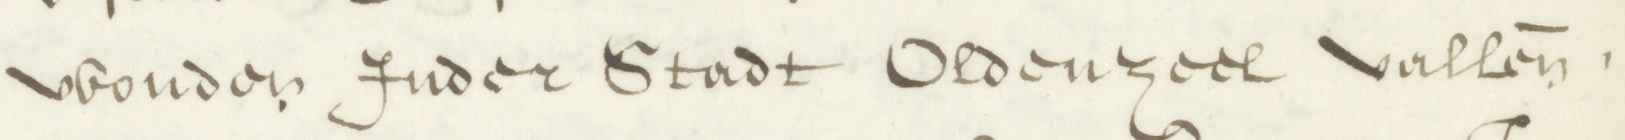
wonden Inder Stadt Oldenzeel vallen
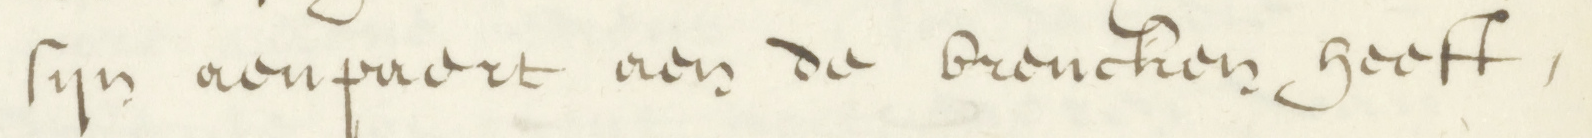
syn aenpaert aen de breucken heeft.
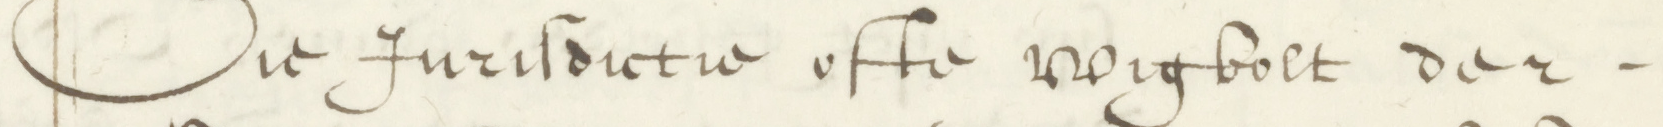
Die Jurisdictie ofte Wigbolt der
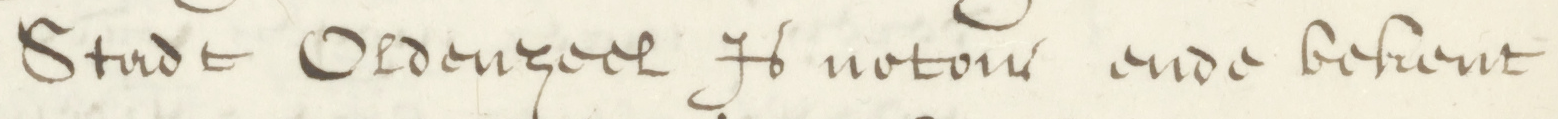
Stadt Oldenzeel Is notoir ende bekent
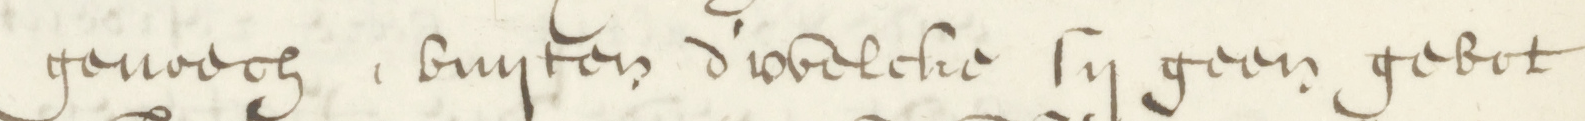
genoech, buyten d'welcke sy geen gebot
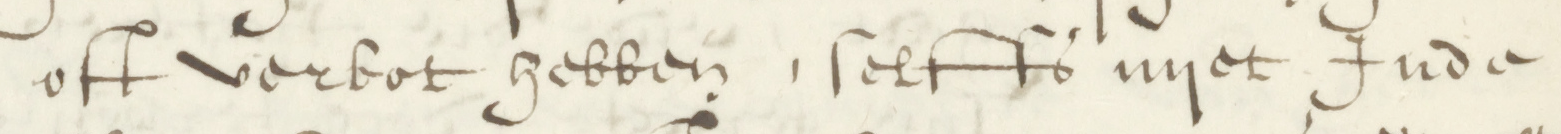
off verbot hebben, selffs nyet Inde
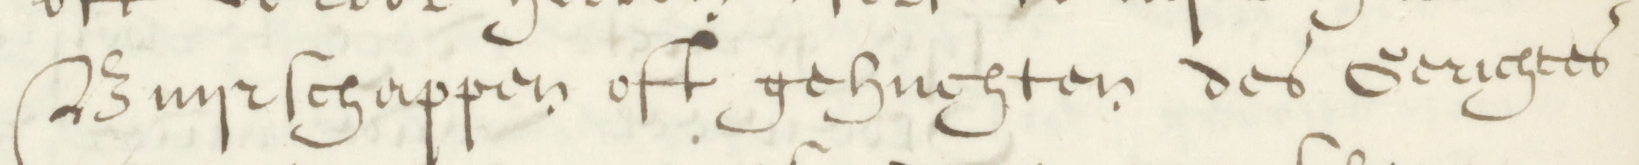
Buyrschappen oft gehuchten des Gerichtes
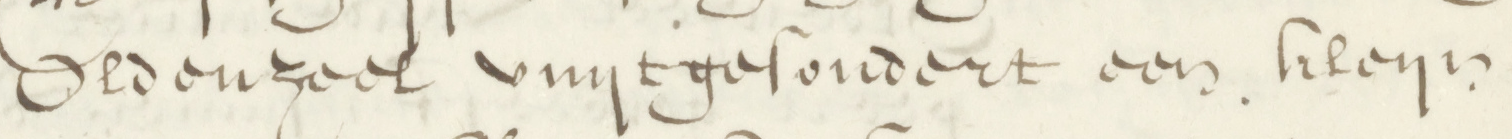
Oldenzeel vuytgesondert een kleyn
